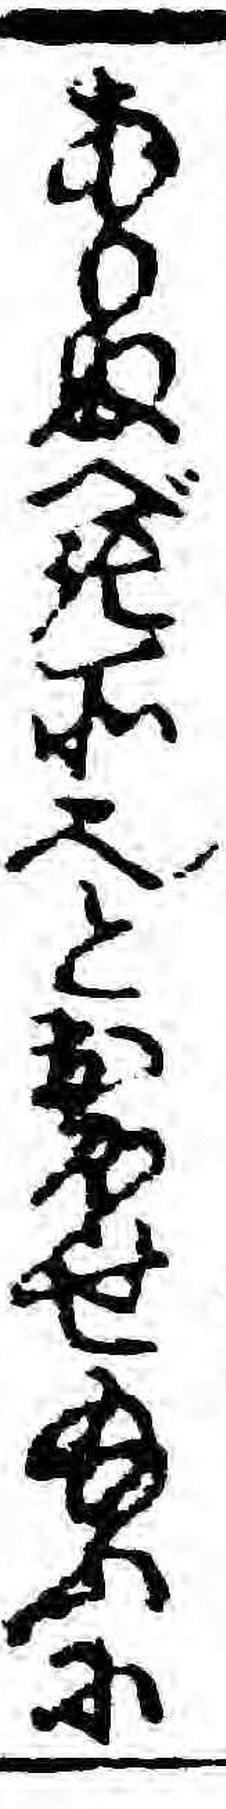ありぬべき所也とおほせ給ふに
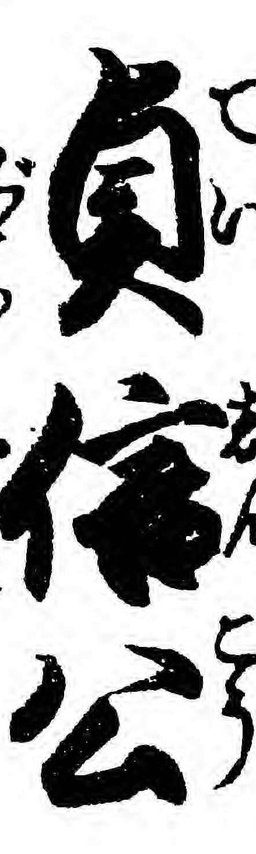貞信公
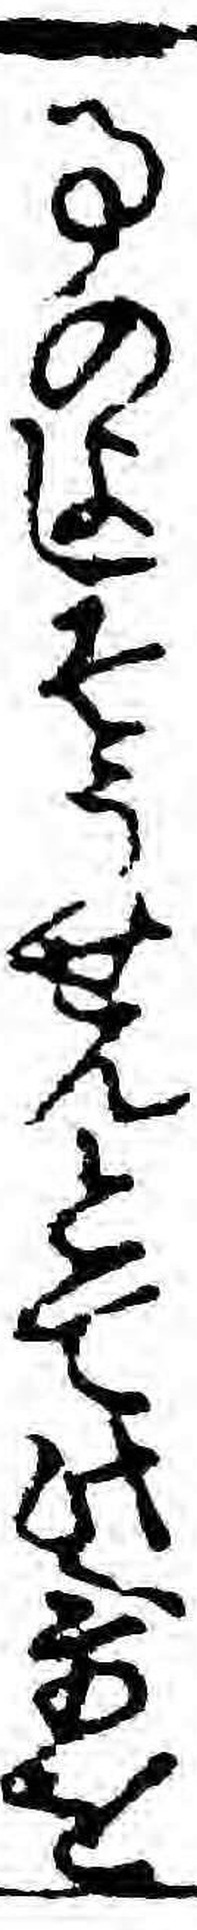事のよしそうせんとて此哥を
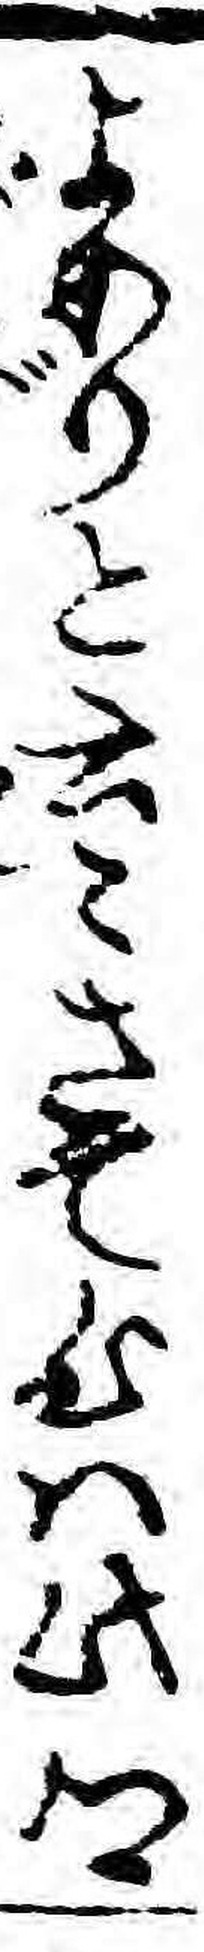よめりと云々さて心は此卿
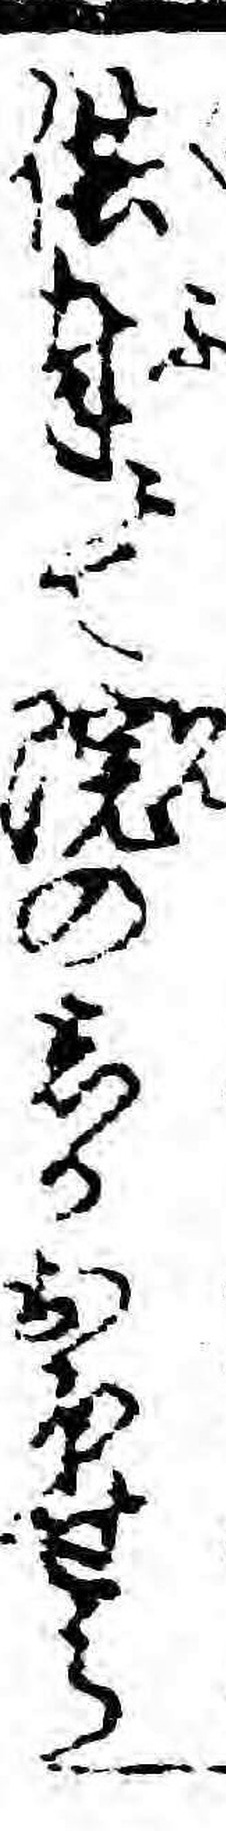供奉にて院のしかおほせら
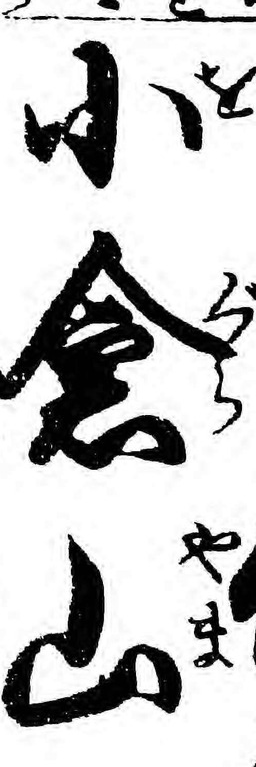小倉山
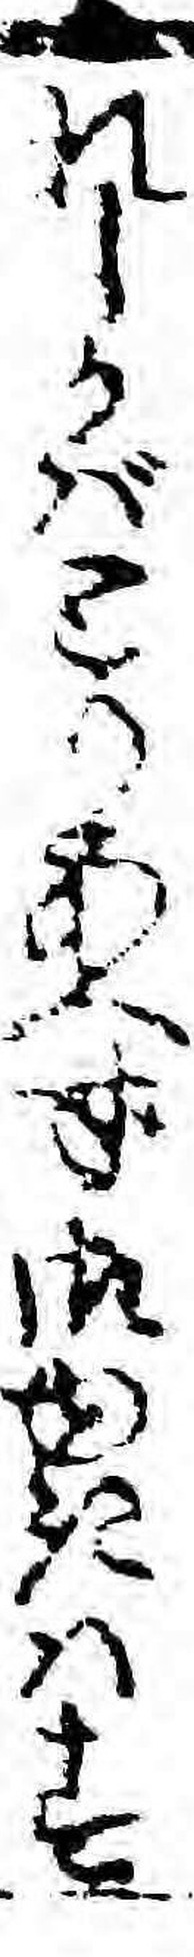れしかばとりあへず御ゆきはす
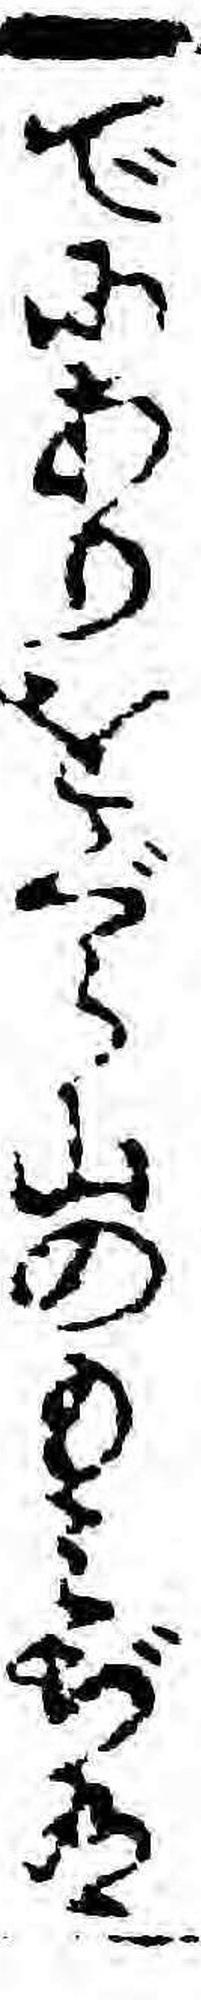でにありをぐら山のもみぢ有
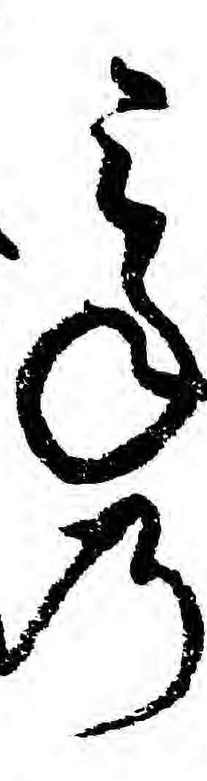みねの
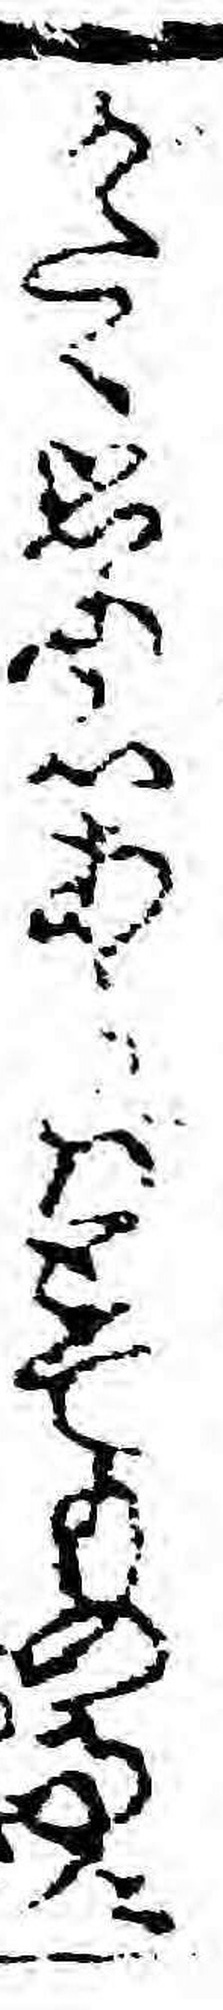がたく思ふ心あらばとてもの事に
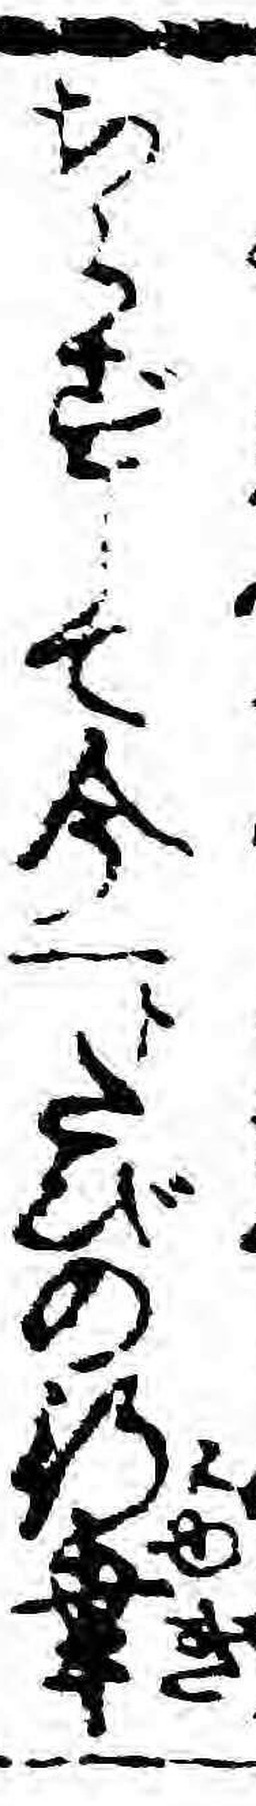ちらずして今一トたびの行幸
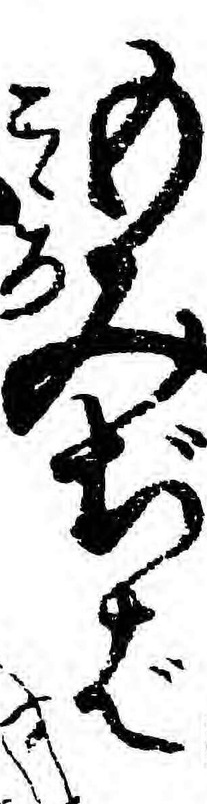もみぢば
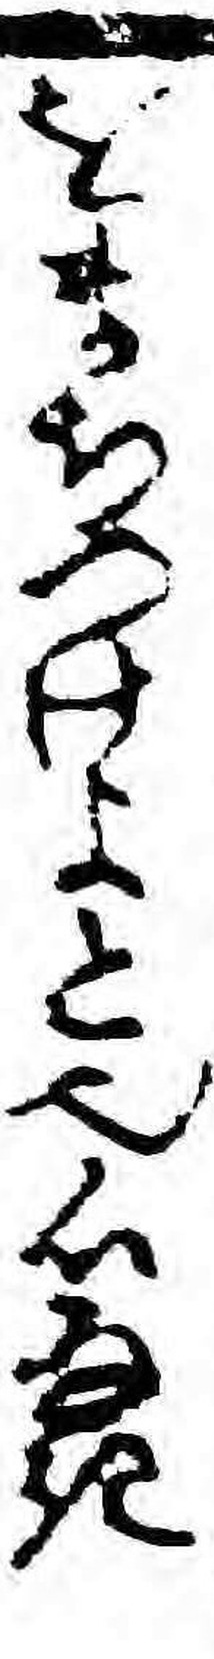をまちつけよと也心なき
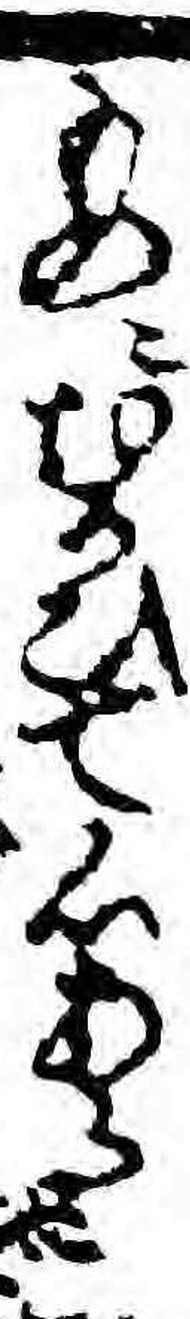ものにむかひて心あら
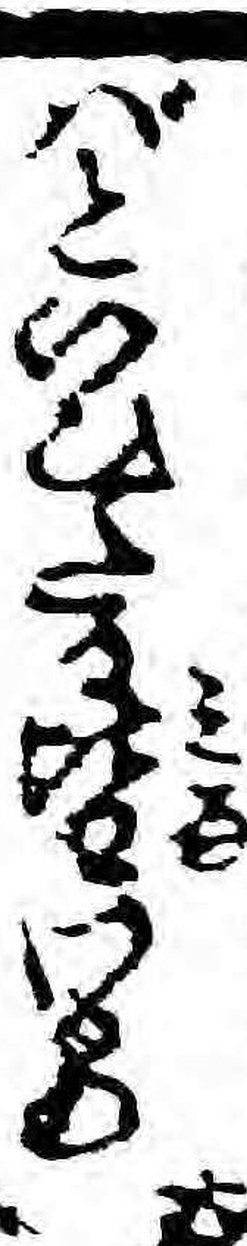ばといひたる皆わかの
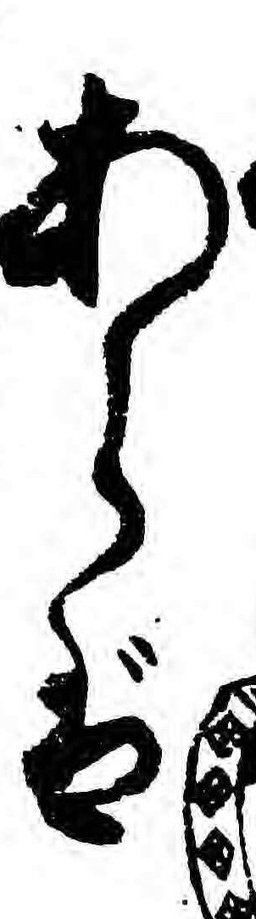あらば
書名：頭書和歌注譯／壽賀多百人一首小倉錦
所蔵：国文学研究資料館
